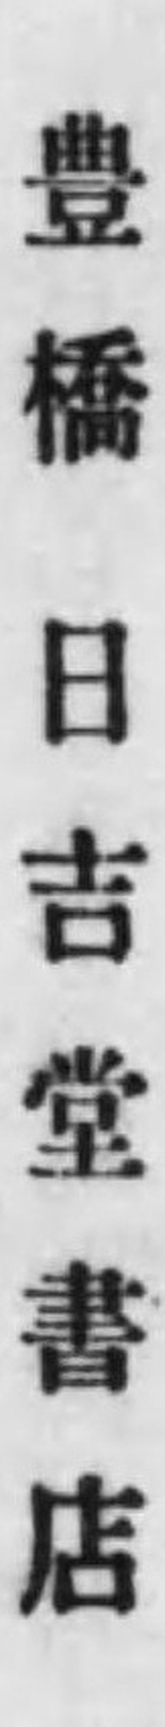豊橋日吉堂書店

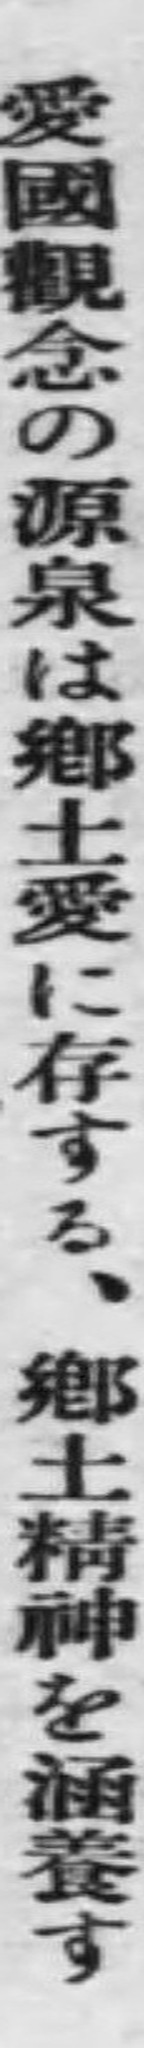愛國観念の源泉は郷土愛に存する、郷土精神を涵養す
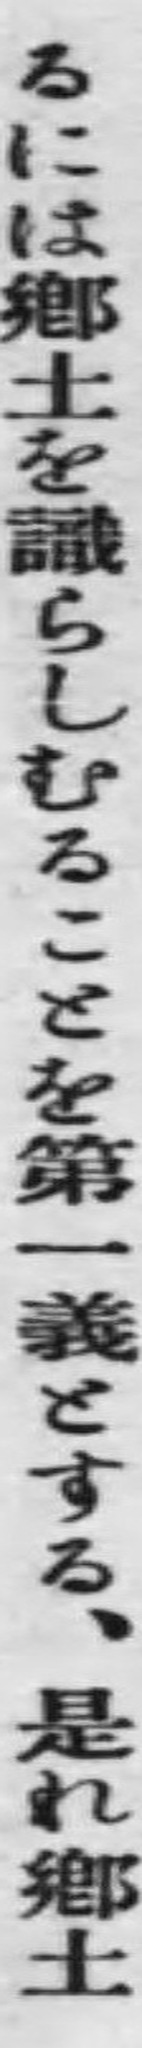るには郷土を識らしむることを第一義とする、是れ郷土
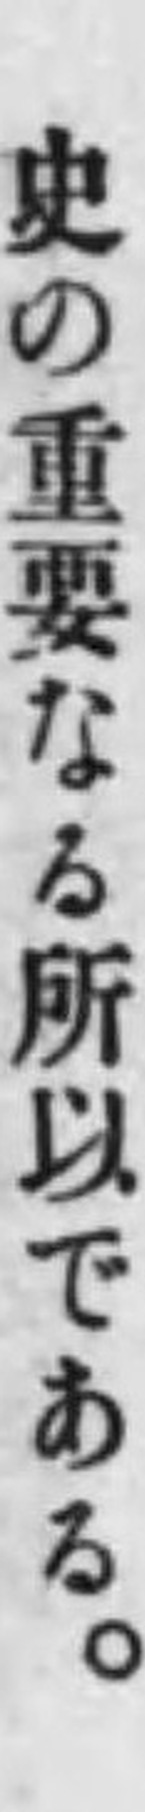史の重要なる所以である。
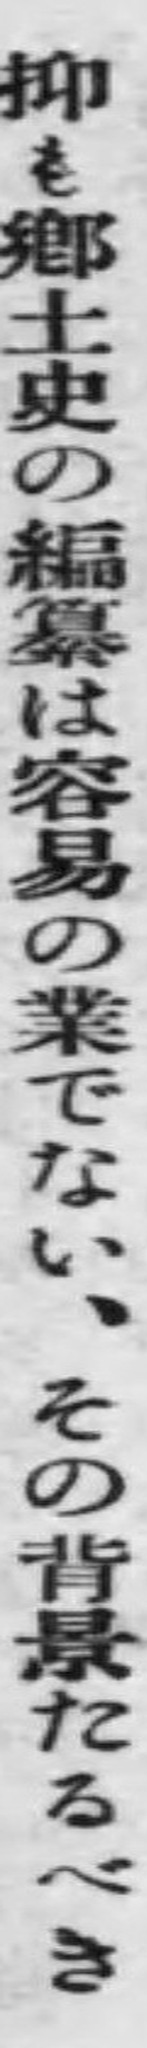抑も郷土史の編纂は容易の業でない、その背景たるべき
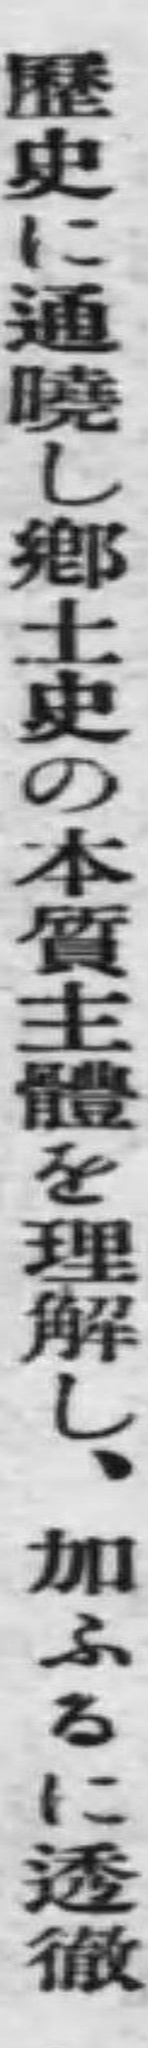歴史に通暁し郷土史の本質主體を理解し、加ふるに透徹
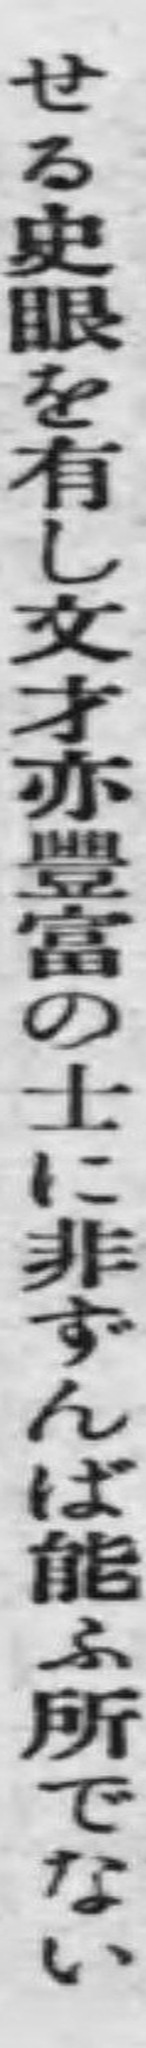せる史眼を有し文才亦豊富の士に非ずんば能ふ所でない
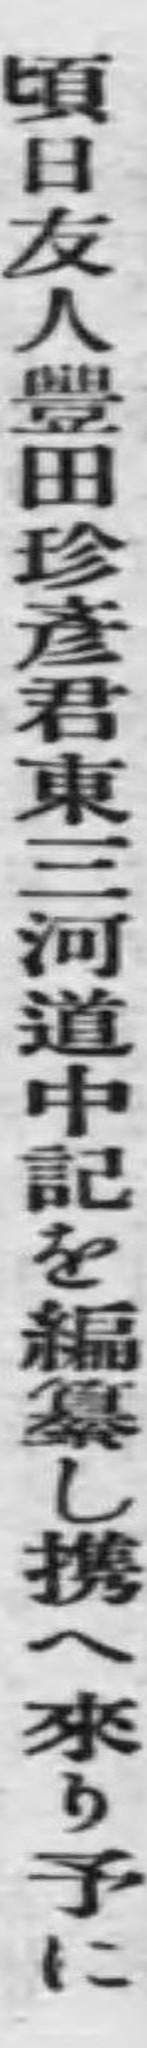頃日友人豊田珍彦君東三河道中記を編纂し携へ來り予に
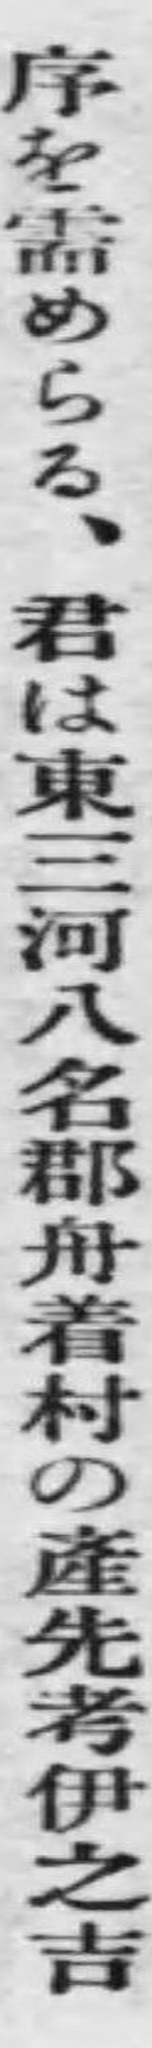序を需めらる、君は東三河八名郡舟着村の産先考伊之吉
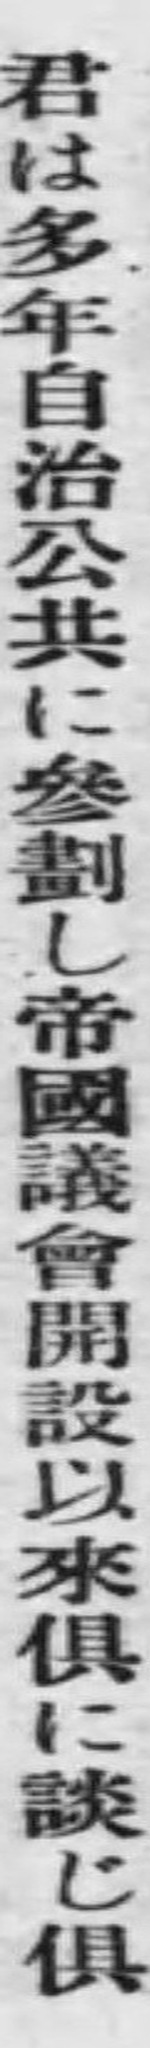君は多年自治公共に参劃し帝國議會開設以來俱に談じ俱
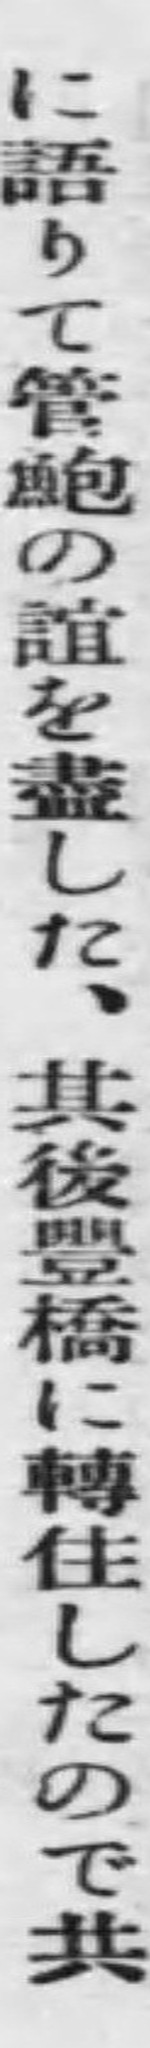に語りて管鮑の誼を盡した、其後豊橋に転住したので共

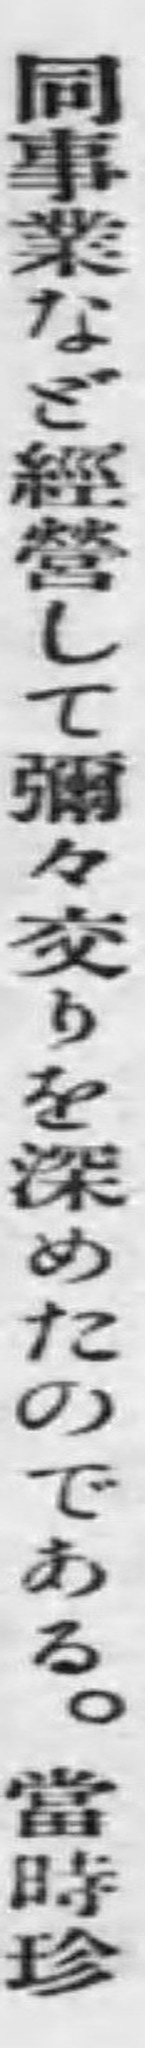同事業など經営して彌々交りを深めたのである。當時珍
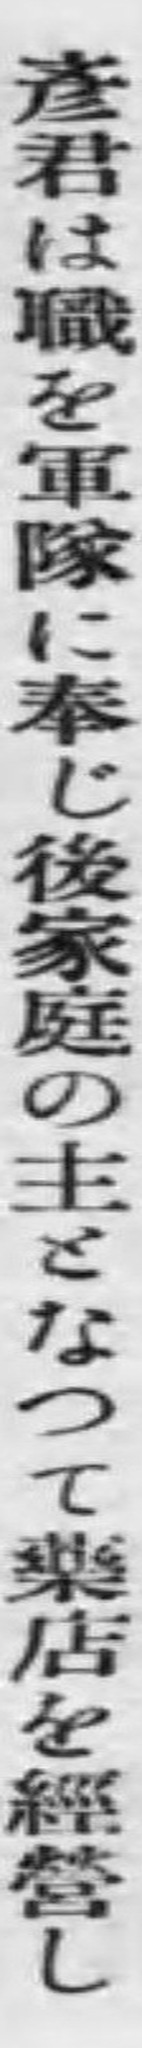彦君は職を軍隊に奉じ後家庭の主となつて薬店を經営し
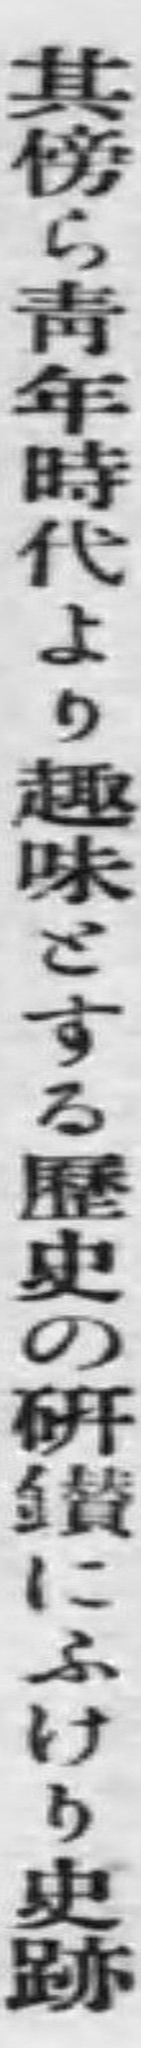其傍ら靑年時代より趣味とする歴史の研鑽にふけり史跡
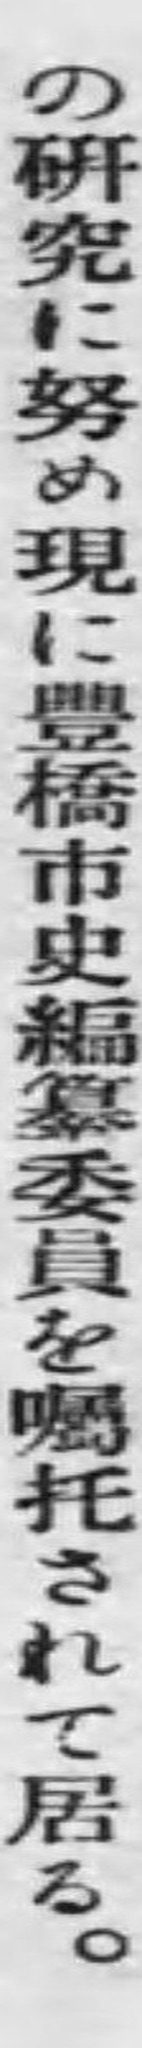の研究に努め現に豊橋市史編纂委員を嘱托されて居る。
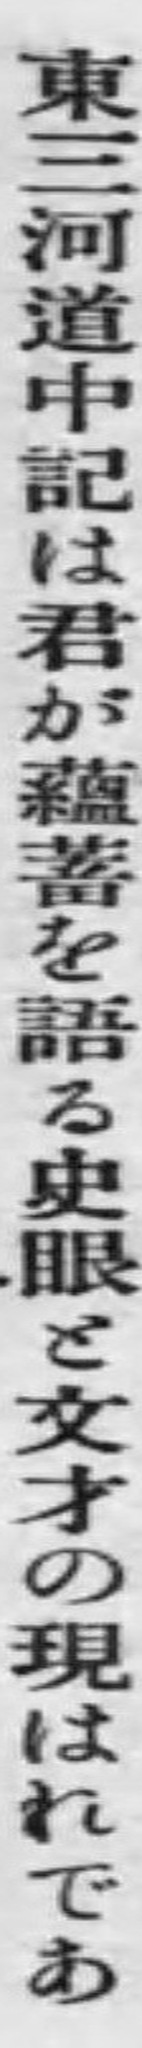東三河道中記は君が蘊蓄を語る史眼と文才の現はれであ
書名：東三河道中記 : 豊橋市及其附近案内
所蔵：国立国会図書館 National Diet Library, JAPAN
